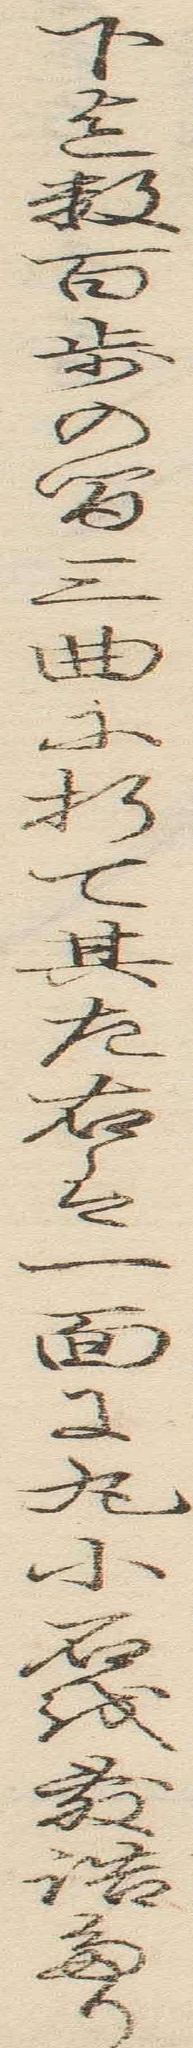下迄数百歩の間三曲に折て其左右は一面に丸小石を敷詰たり
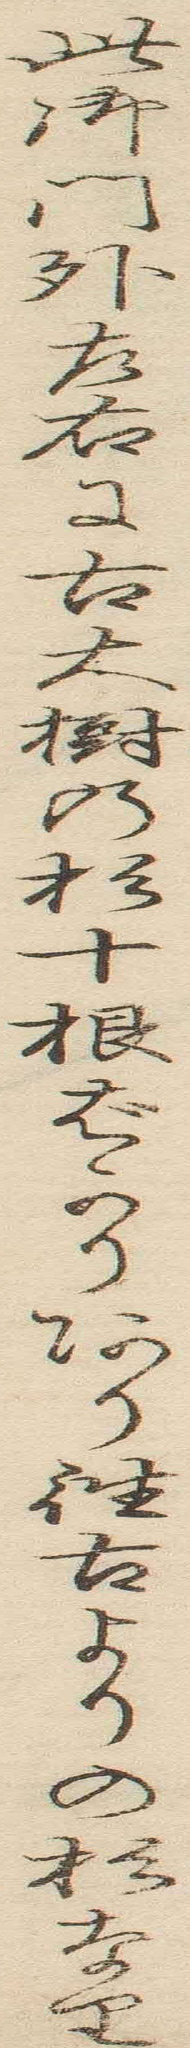此御門外左右に古大樹の杉十根ばかりあり徃古よりの杉なり

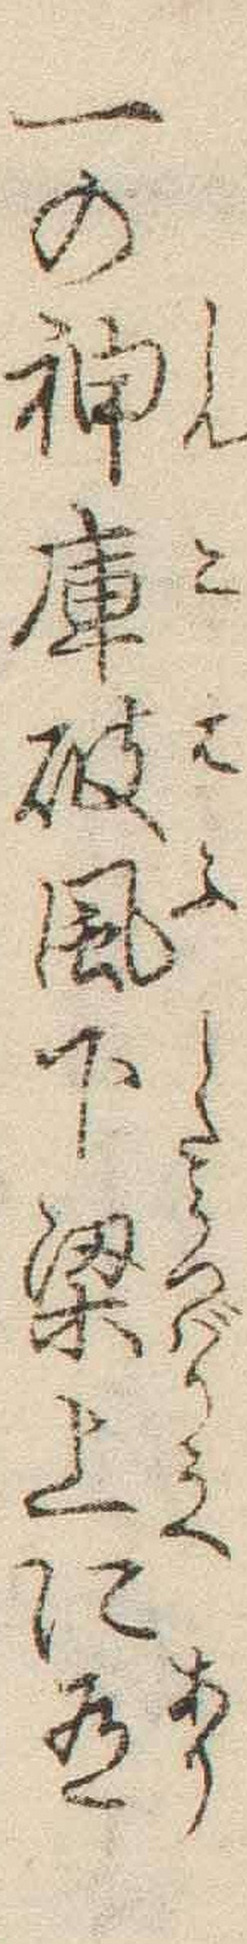一の神庫破風下梁上に有
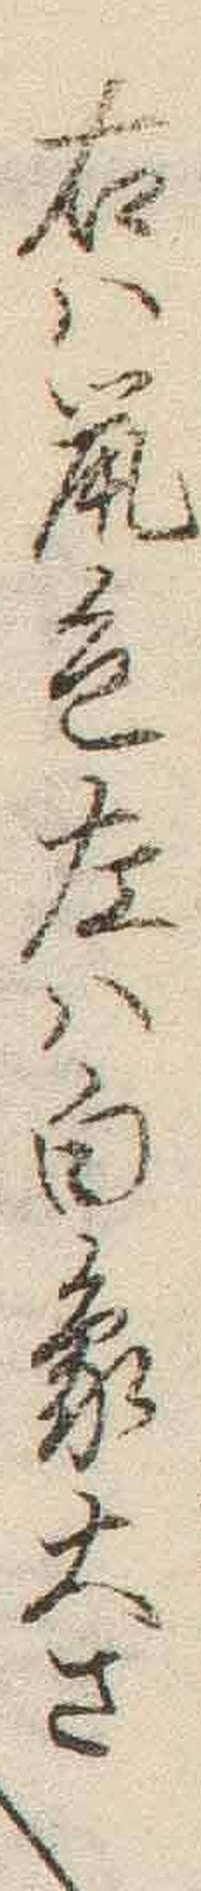右は鼡色左は白象大さ
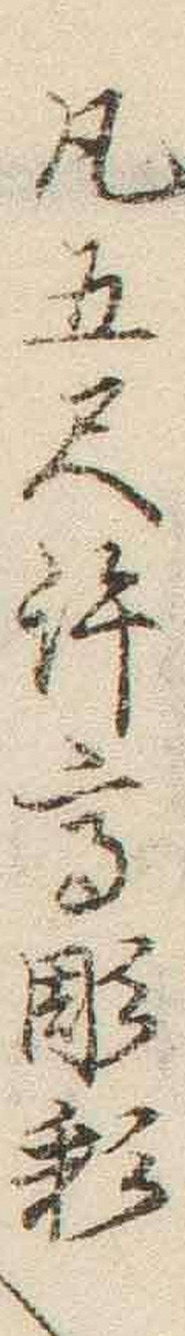凡五尺許高彫彩
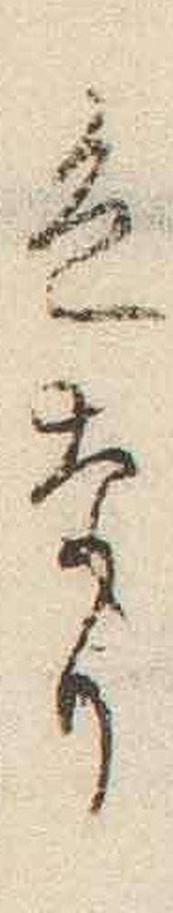色なり

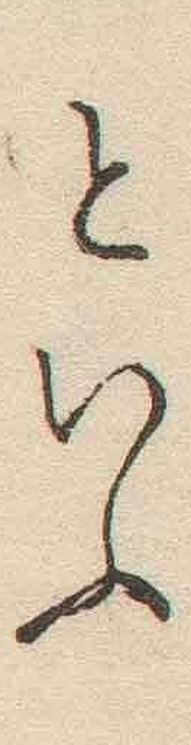といふ
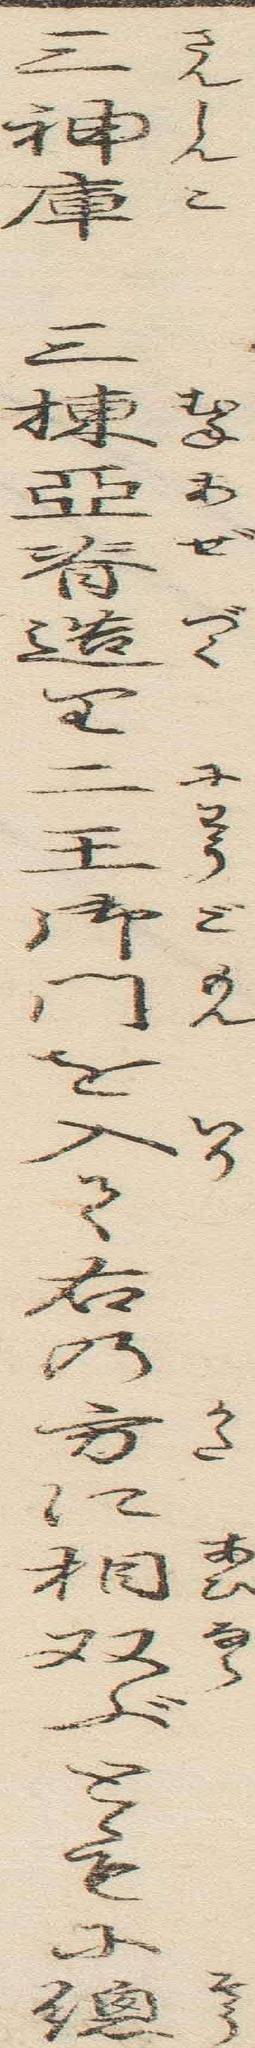三神庫三棟亞脊造り二王御門を入て右の方に相双ぶともに總
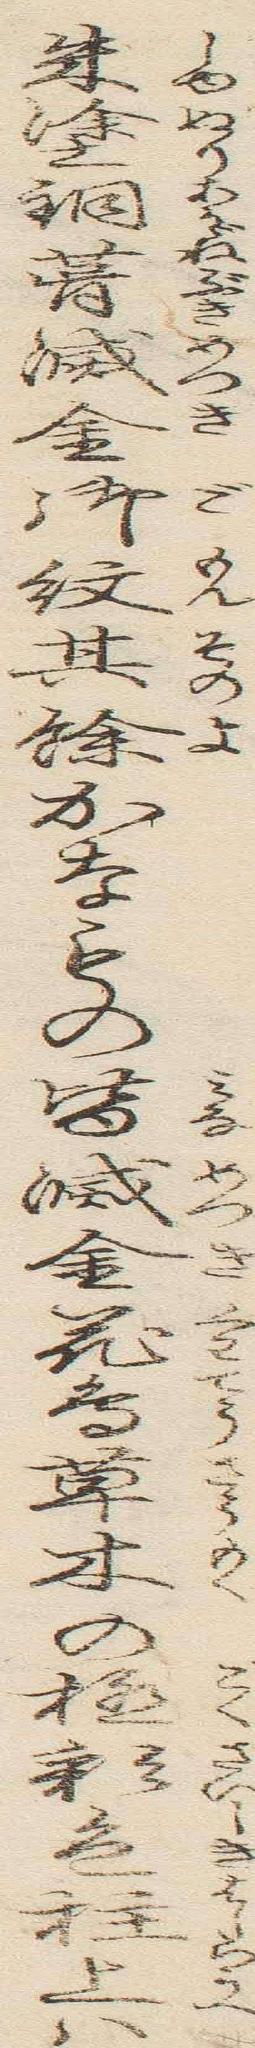朱塗銅葺滅金御紋其餘かなもの皆滅金花鳥草木の極彩色柱上は
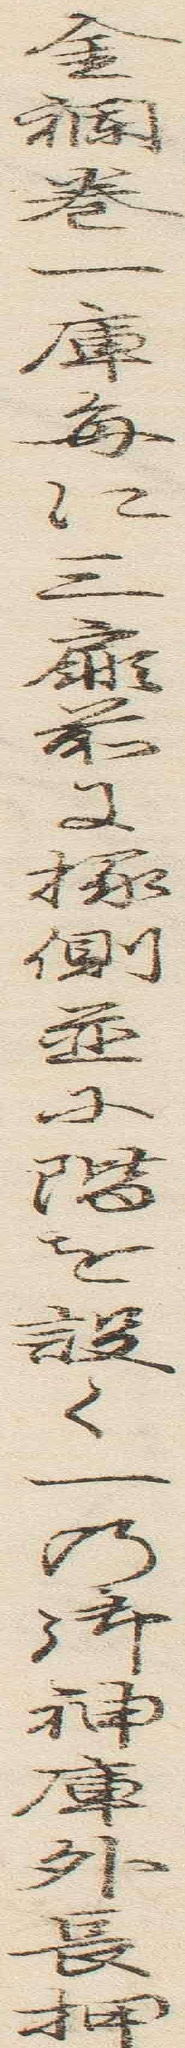金襴巻一庫毎に三扉前に椽側並に階を設く一の御神庫外長押
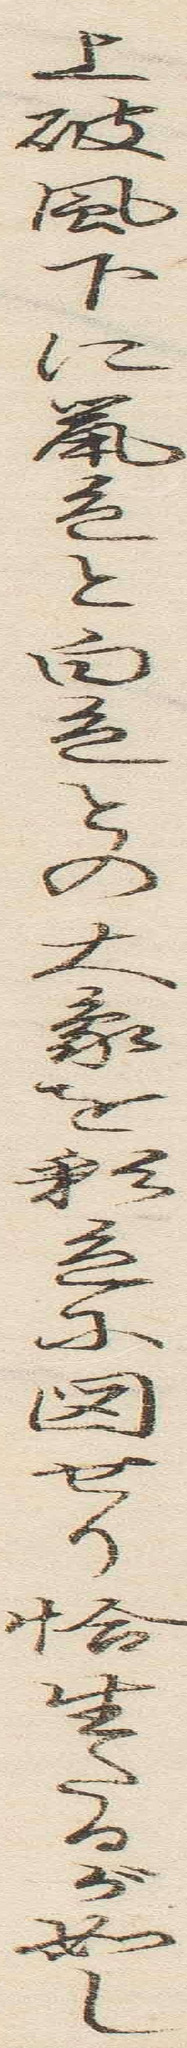上破風下に鼡色と白色との大象を彩色に図せり恰生たるが如し
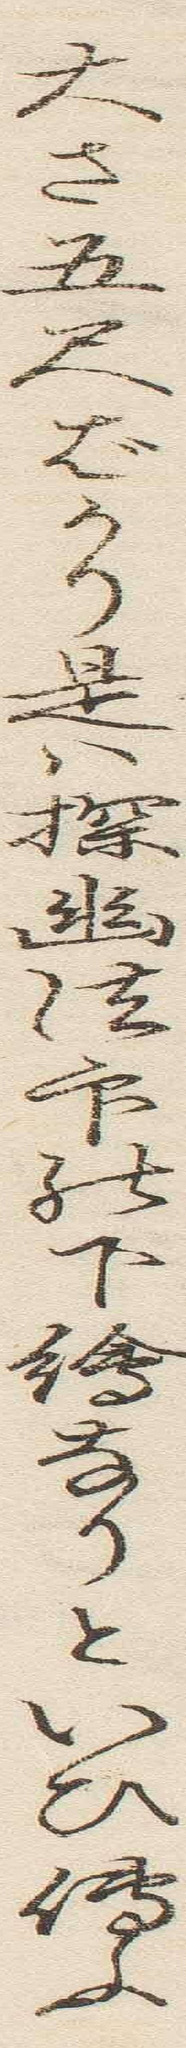大さ五尺ばかり是は探幽法印の下繪なりといひ傳ふ
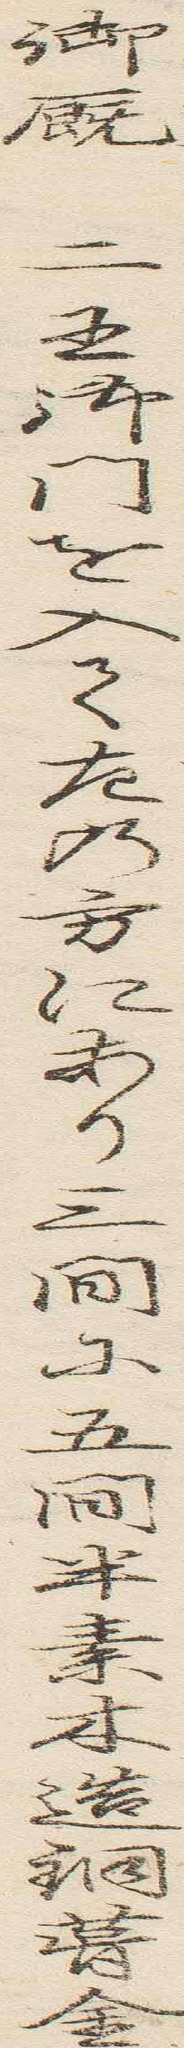御厩二王御門を入て左の方にあり三間に五間半素木造銅葺金
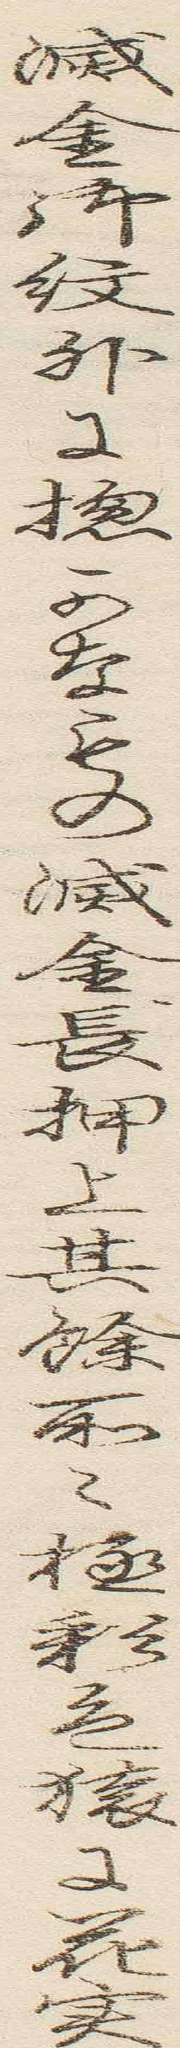滅金御紋外に揔かなもの滅金長押上其餘所〻極彩色猿に花実
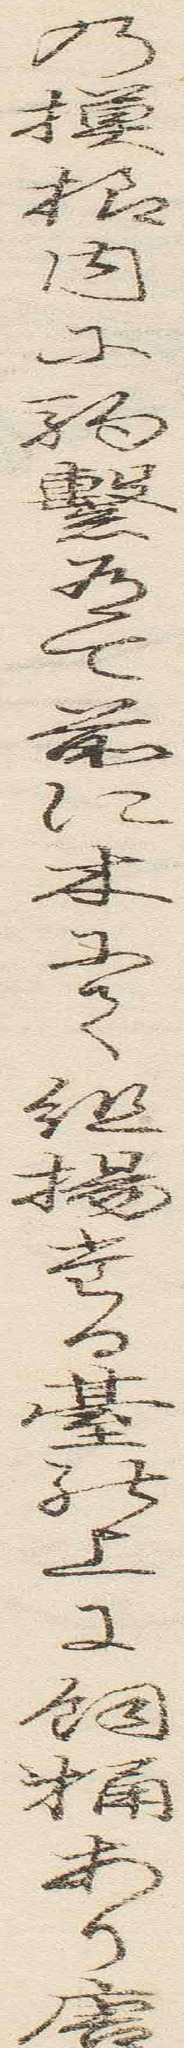の摸様内に駒繫有て前に木にて組揚たる臺の上に飼桶あり唐
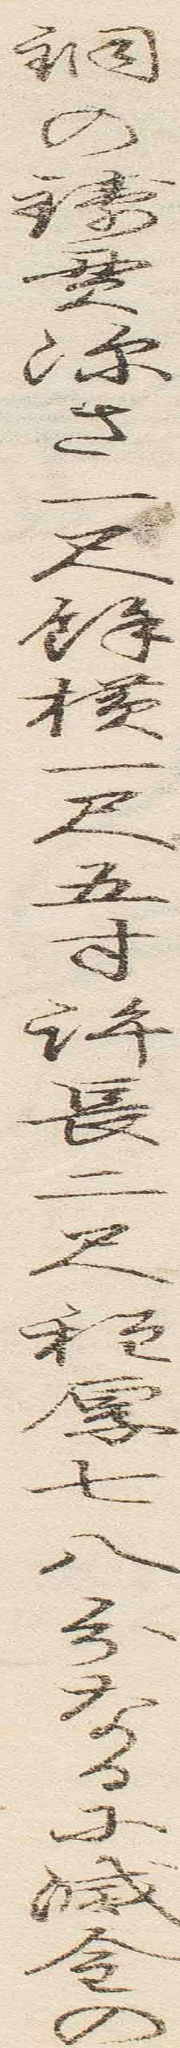銅の鋳貫深さ一尺餘横一尺五寸許長二尺程厚七八分なるに滅金の
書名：日光山志
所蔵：東京学芸大学附属図書館 国文学研究資料館
